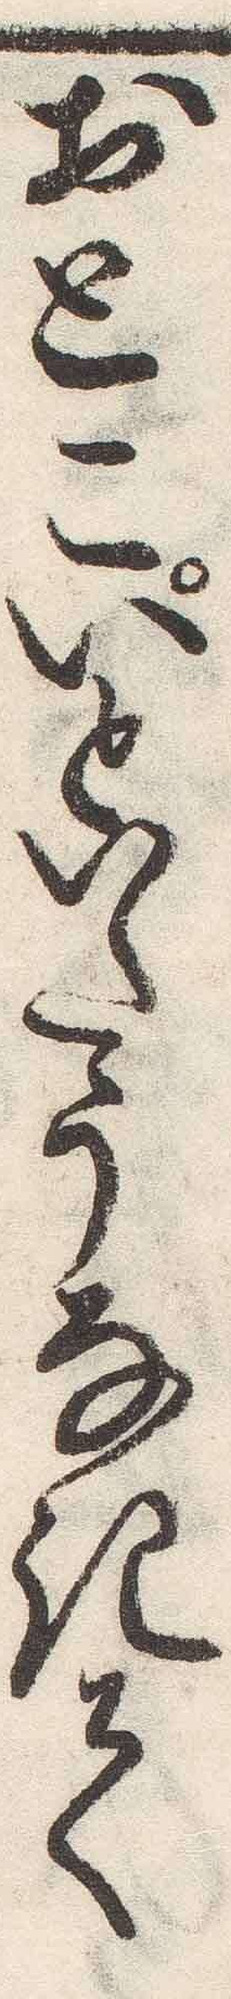おとこ。いといたうなきて
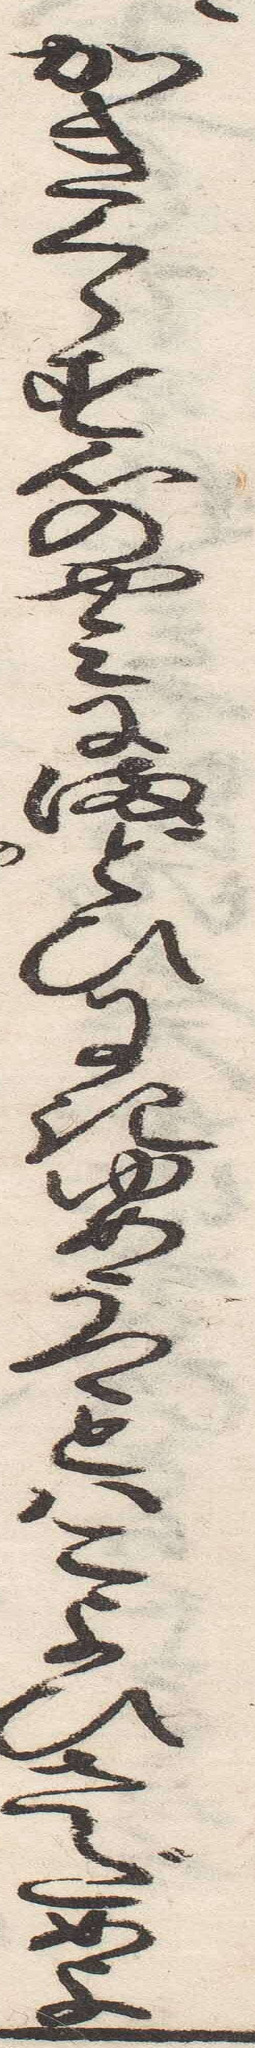古今かきくらす心のやみにまどひにきゆめうつゝとはこよひさだめよ
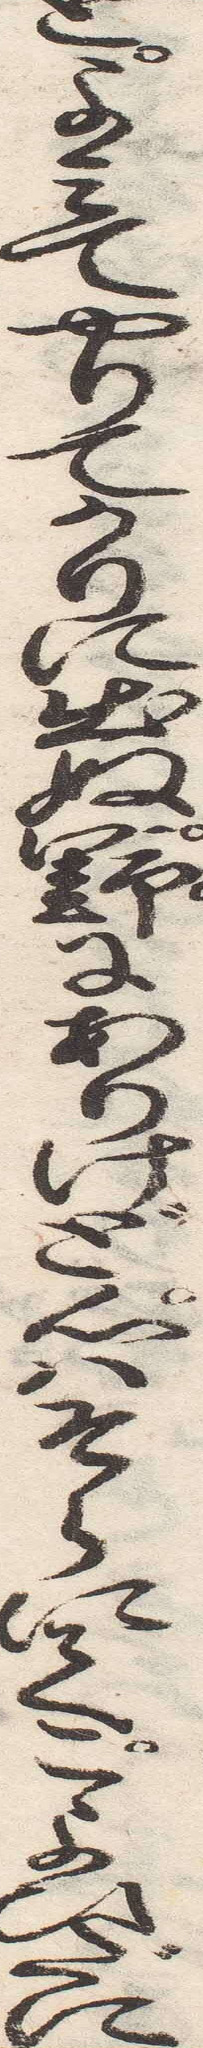と。よみてやりてかりに出ぬ。野にありけど。心はそらにて。こよひだに
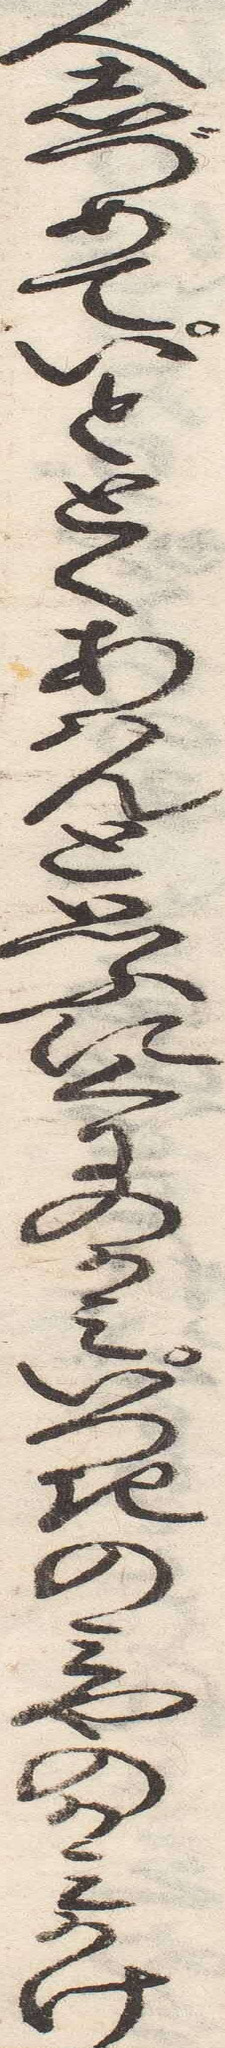人しづめて。いととくあはんと思ふにくにのかみ。いつきのみやのかみかけ

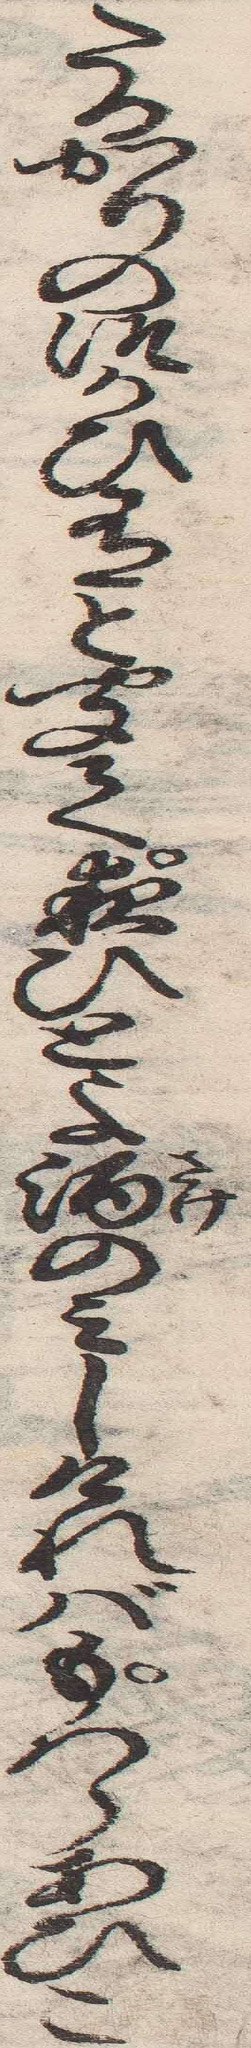たるかりのつかひ有と聞て。夜ひとよ酒のみしければ。もはらあひこ
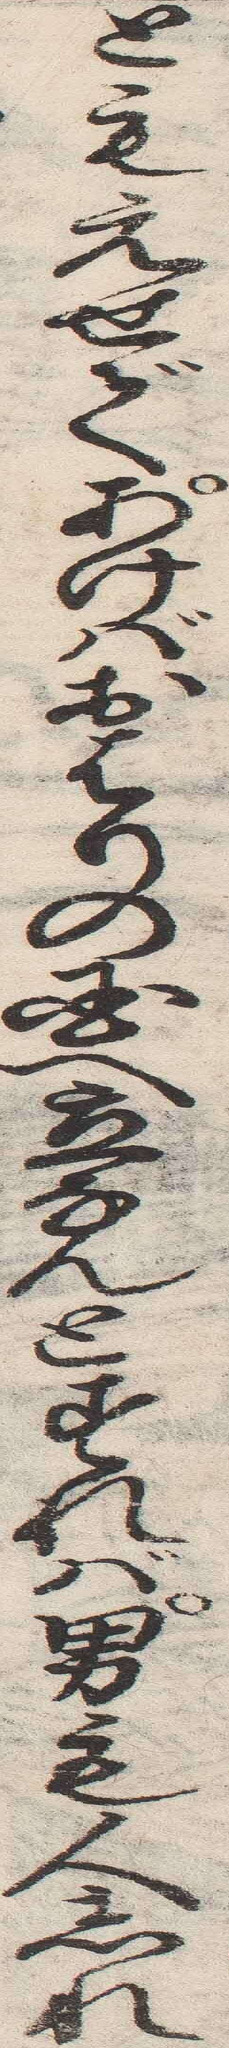ともえせで。あけばおはりの国へ立なんとすれば。男も人しれ
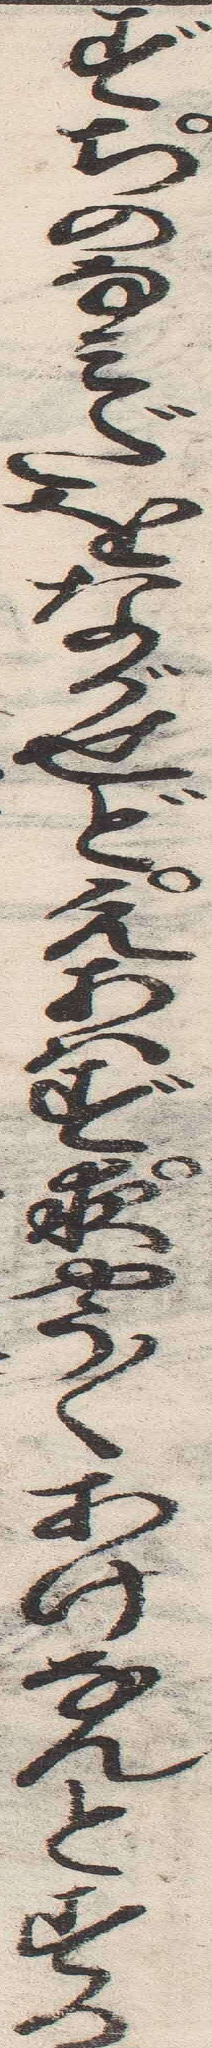ず。ちのなみだをながせど。えあはず。夜やう〳〵あけなんとする
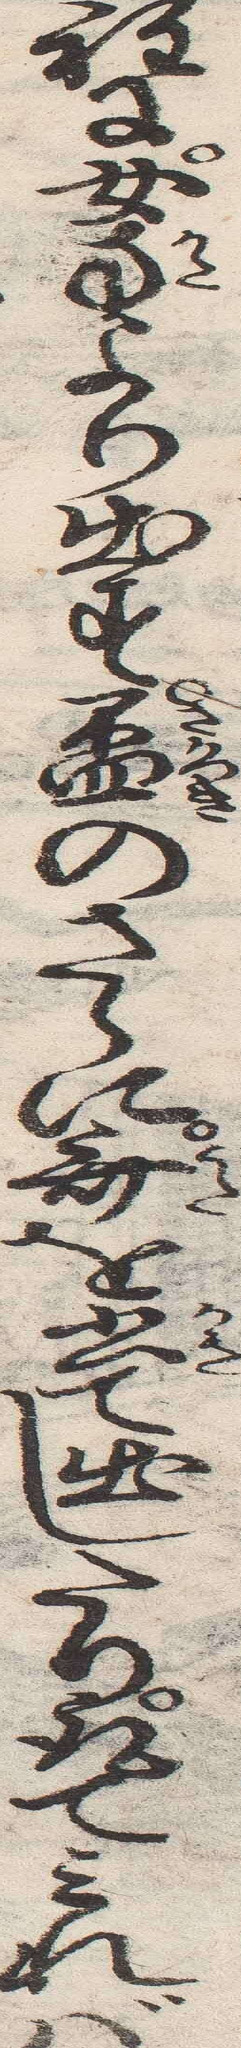程に。女方より出す。盃のさらに。哥を書て出したり。取てみれば
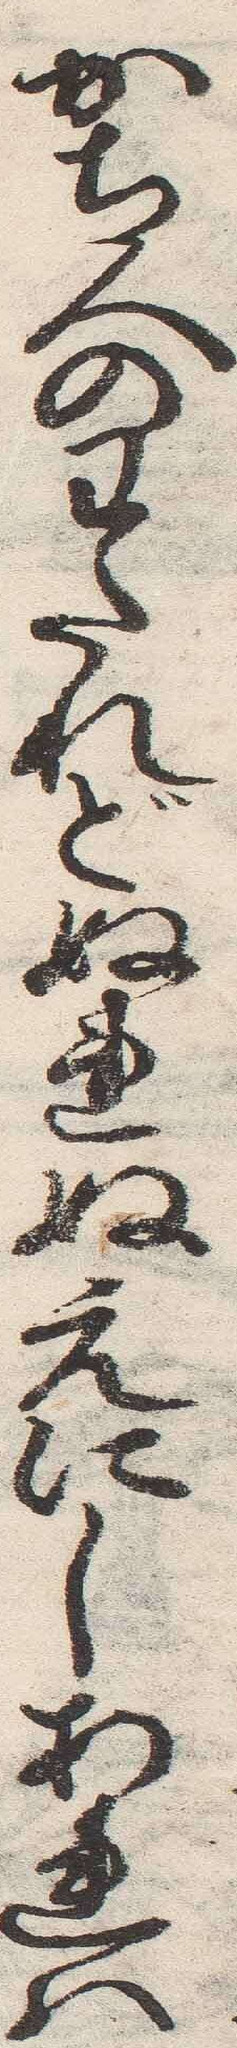かち人のわたれとぬれぬえにしあれは
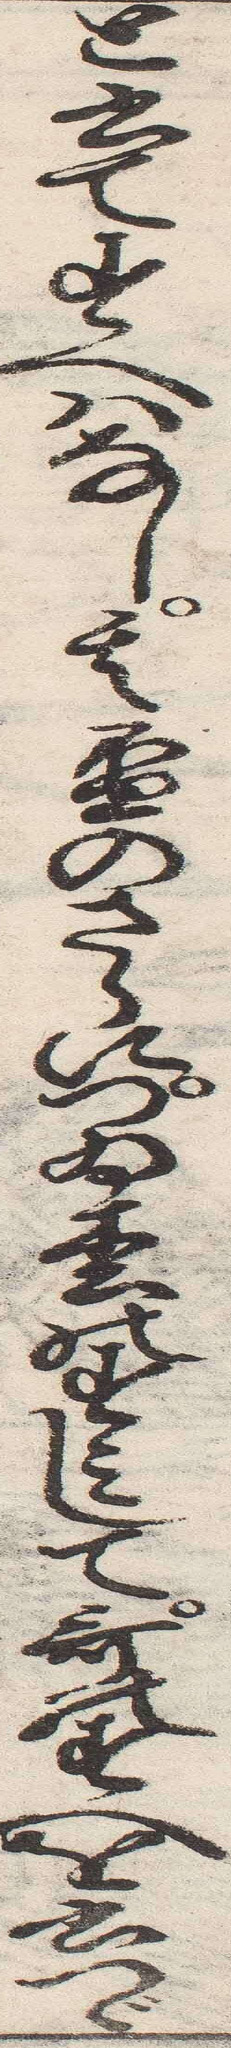と書てすへはなし。其盃のさらに。つゐ松のすみして。哥のすへを書つぐ
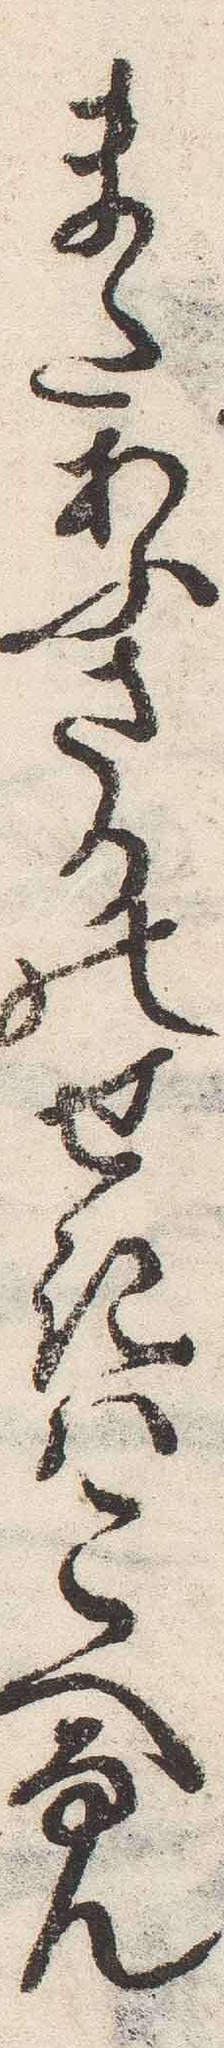またあふさかのせきはこへなん
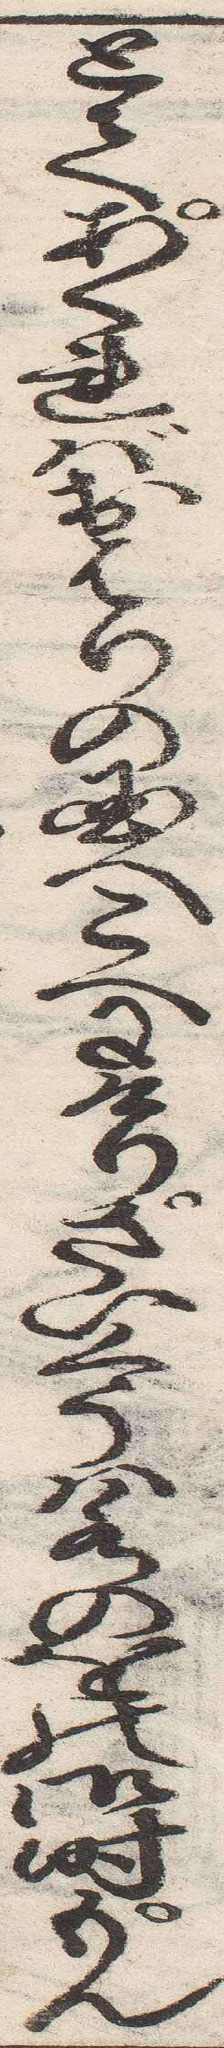とて。あくればおはりの国へこへにけり。さいくうは水のをの御時。もん
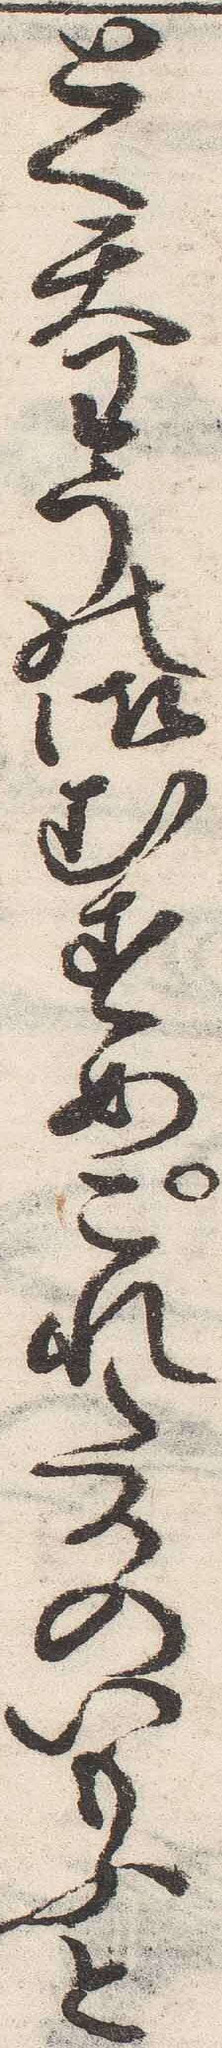とく天わうの御むすめ。これたかのいもふと
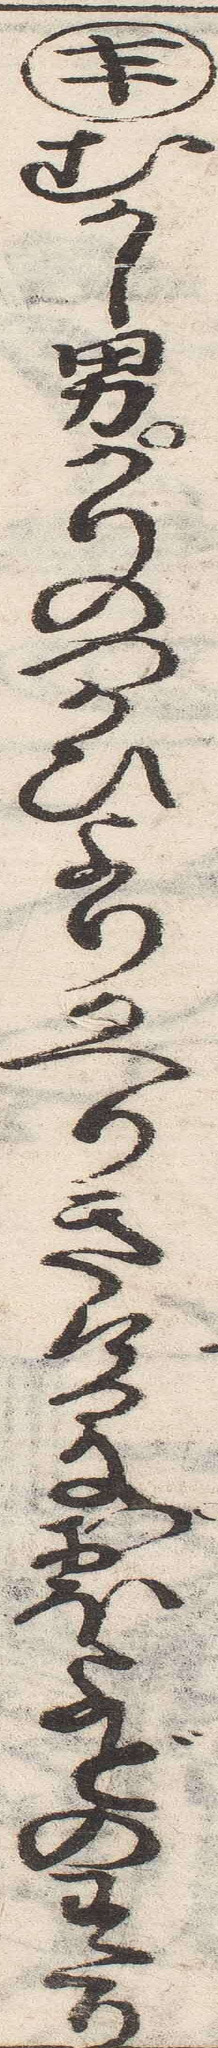七十むかし男。かりのつかひよりかへりきけるに。おほよどのわたり
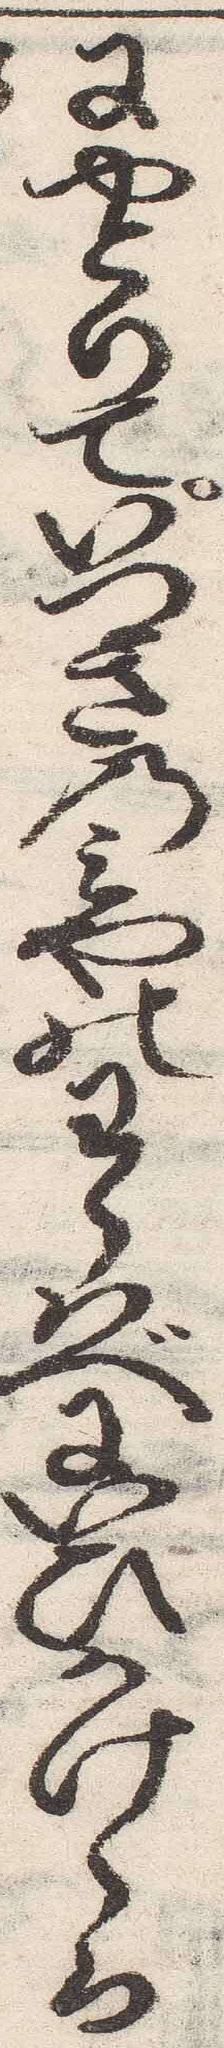にやとりて。いつきのみやのわらはべにいひかけゝる
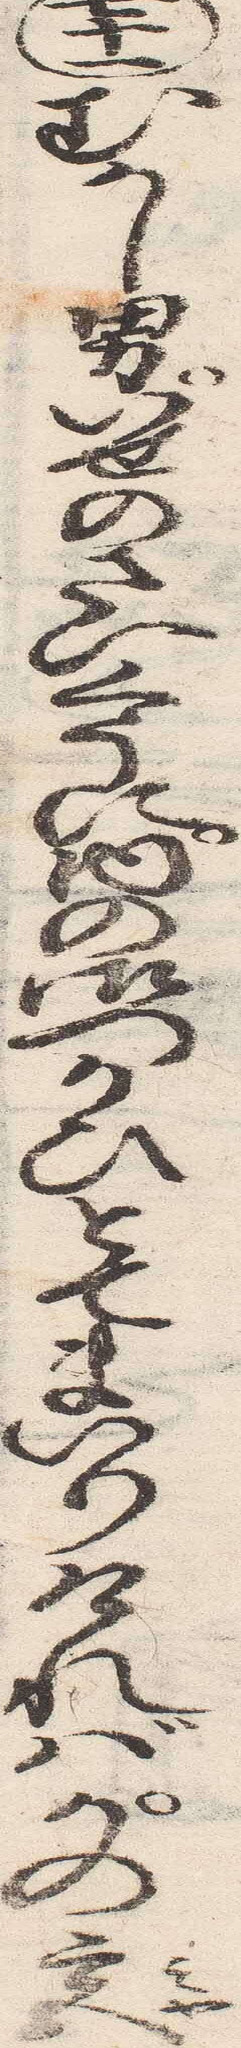七十一むかし男。いせのさいくうに。内の御つかひとてまいりければ。かの宮
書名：伊勢物語
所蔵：東京学芸大学附属図書館 国文学研究資料館
